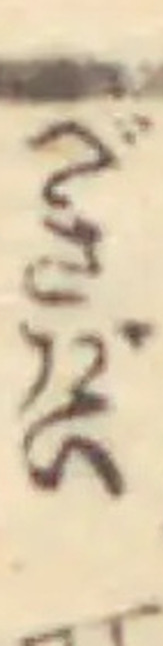べきだい
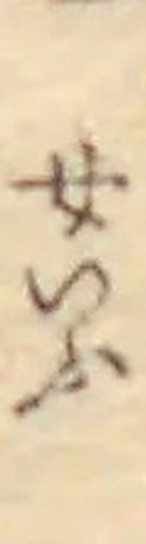女いふ
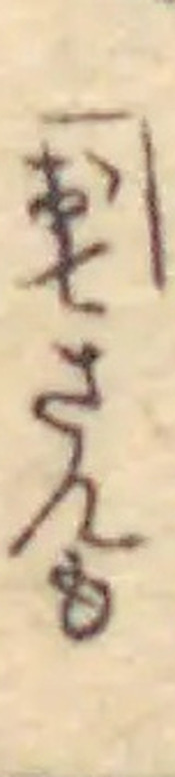乁お七さんも
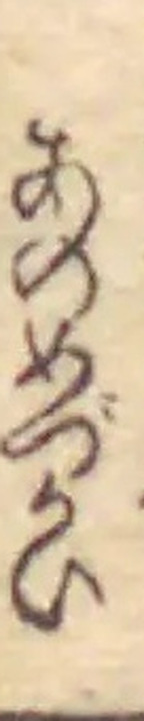あのめづかい
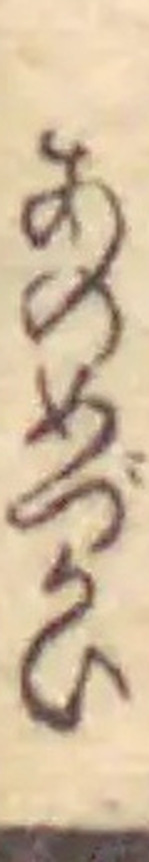あのめづかい
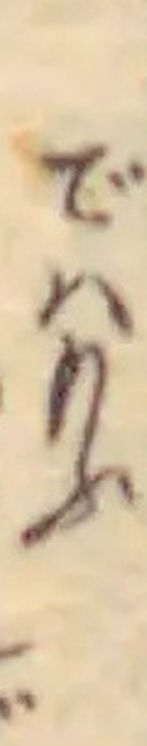ではもふ
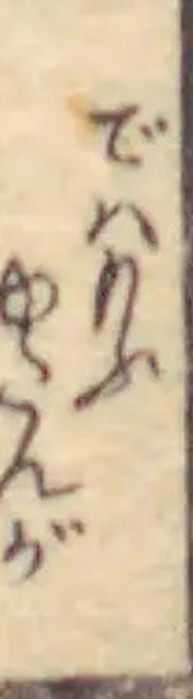ではもふ
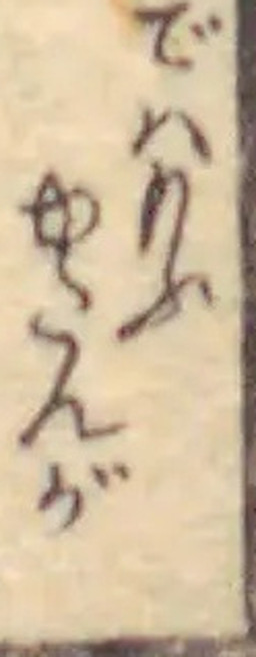ゆたんが
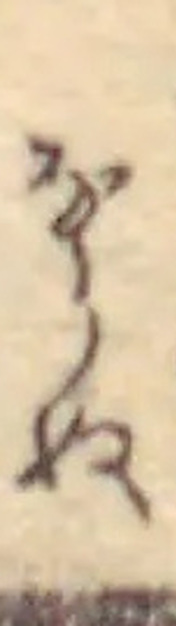ならぬ
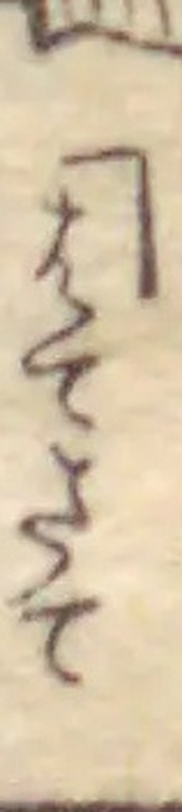乁はてさて
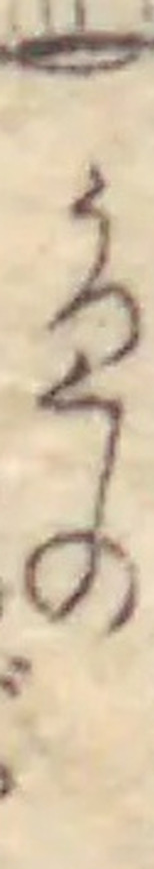うつくしの
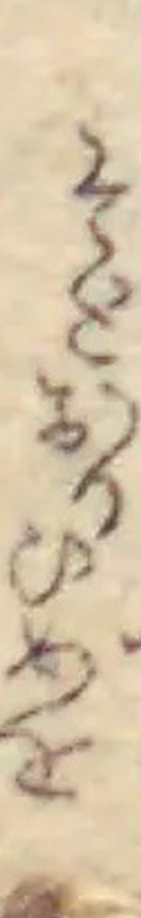そとおりひめを
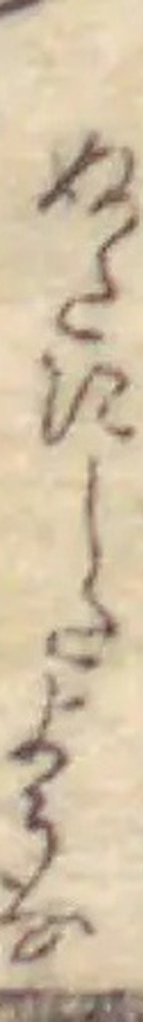ぬたにしたような
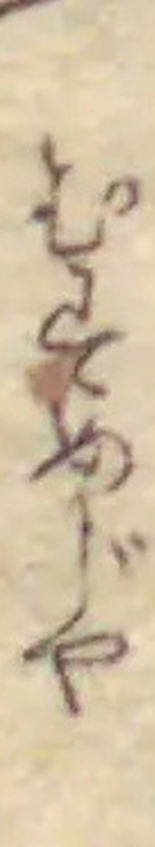むすめじや

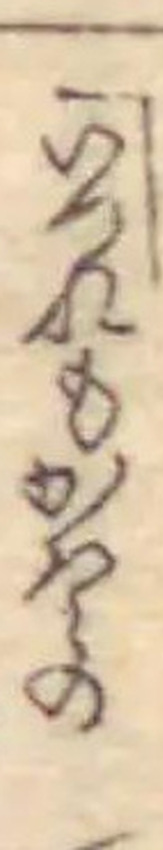乁いつれもかはらの
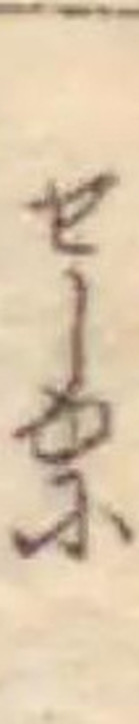せしゆに
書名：児訓影絵喩 3巻
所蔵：国立国会図書館 National Diet Library, JAPAN
